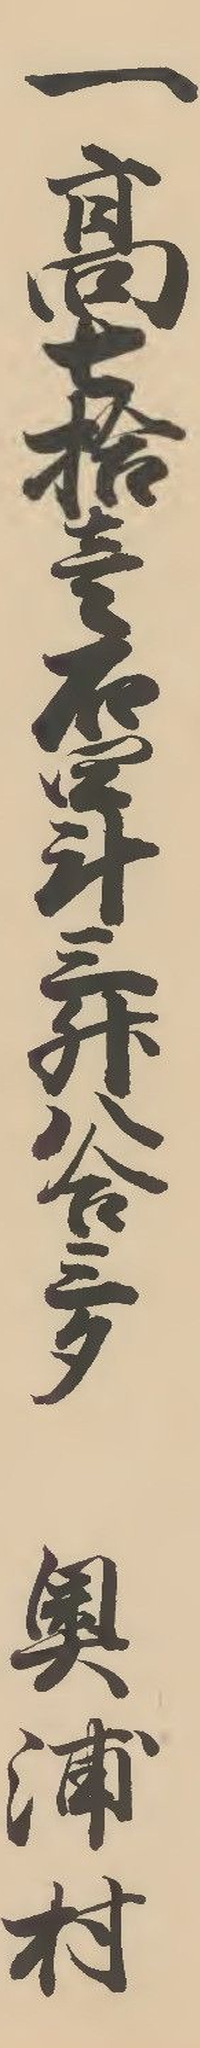一髙七拾壱石四斗三升八合三夕奥浦村
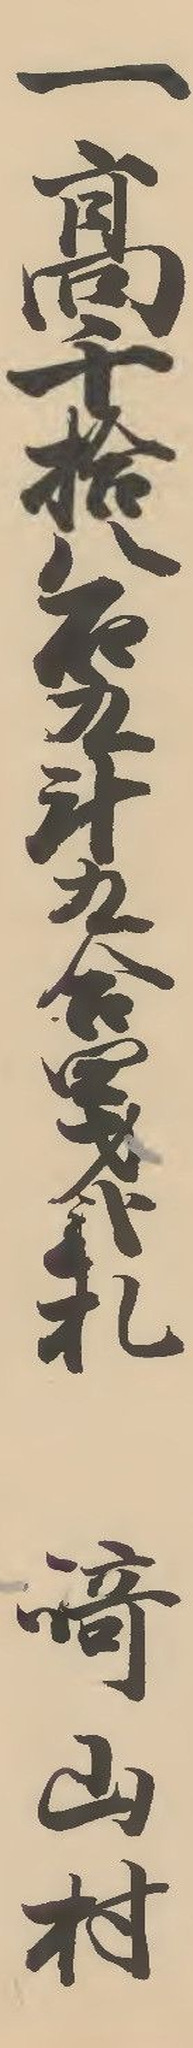一髙千拾八石九斗九合四才弐札崎山村

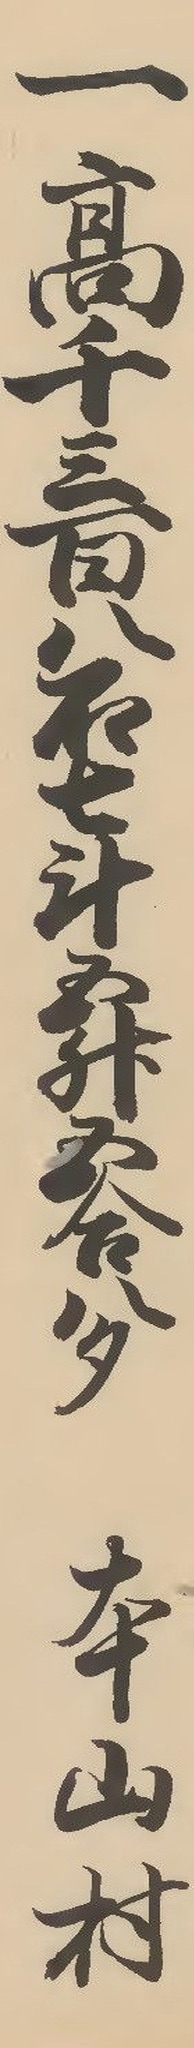一髙千三百八石七斗五升五合八夕本山村
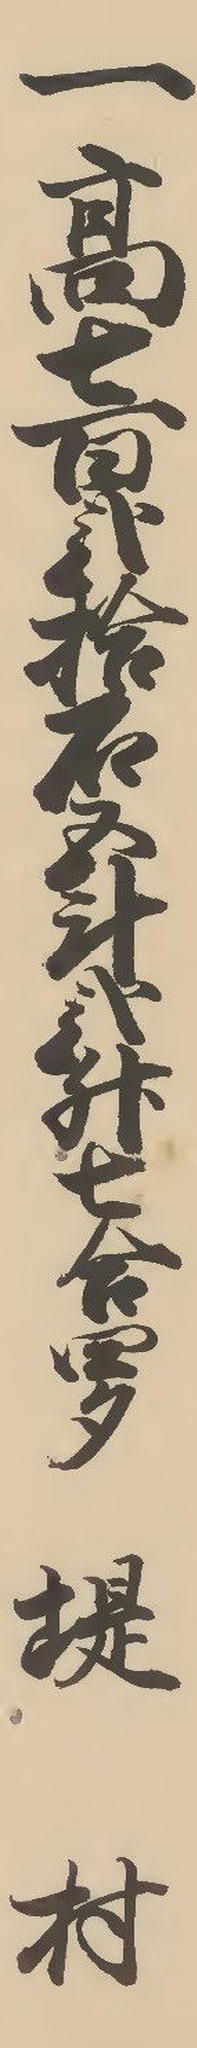一髙七百弐拾石五斗弐升七合四夕堤村
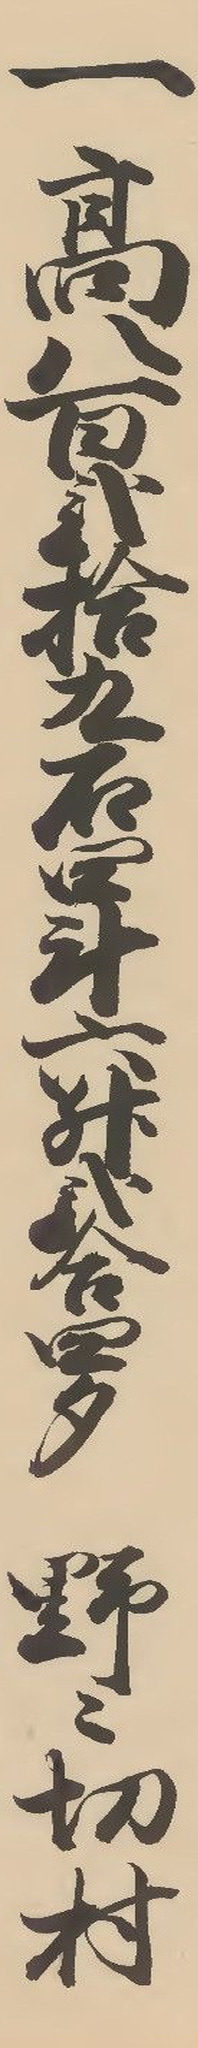一髙八百弐拾九石四斗六升弐合四野々切村
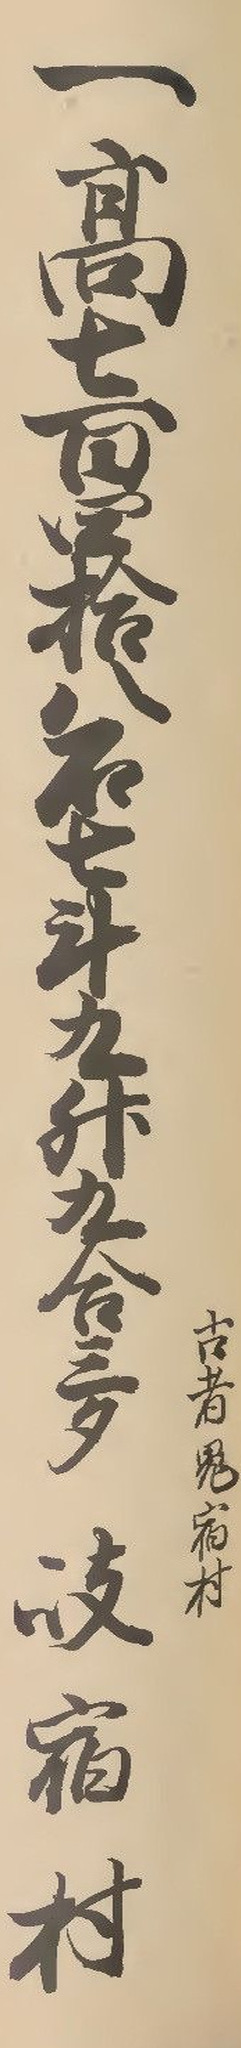一髙七百四拾八石七斗九升九合三夕岐宿村
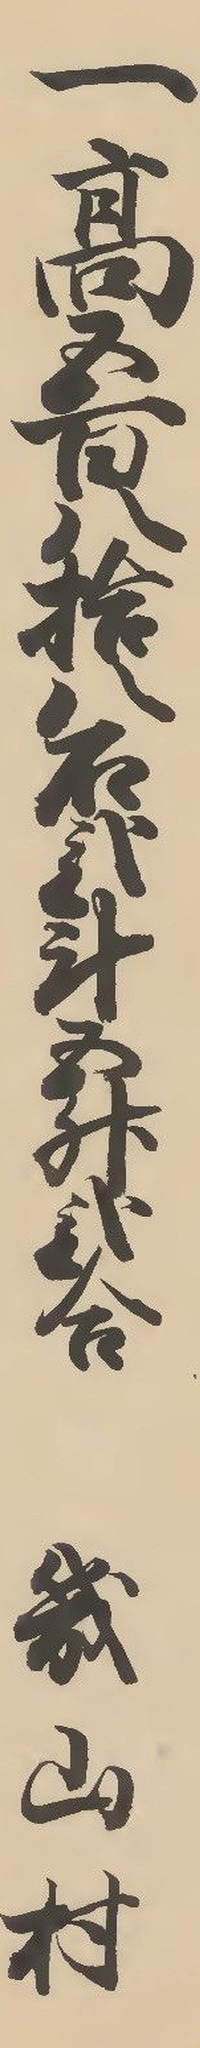一髙五百八拾八石弐斗五升弐合幾山村
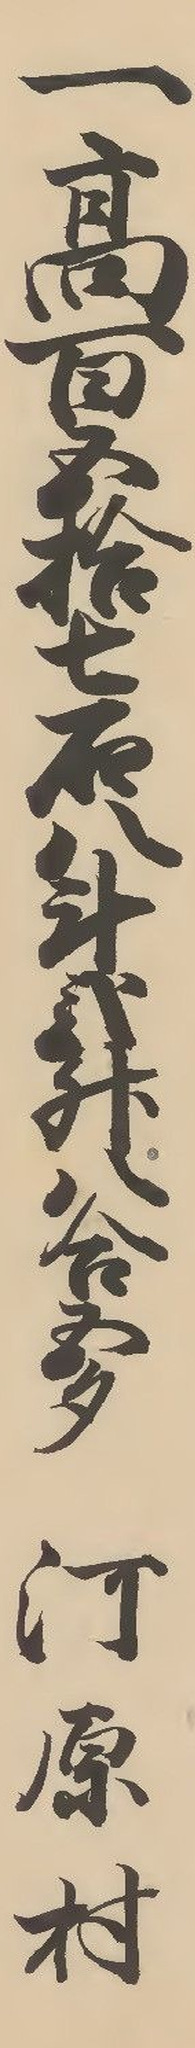一髙百五拾七石八斗弐升八合五夕河原村
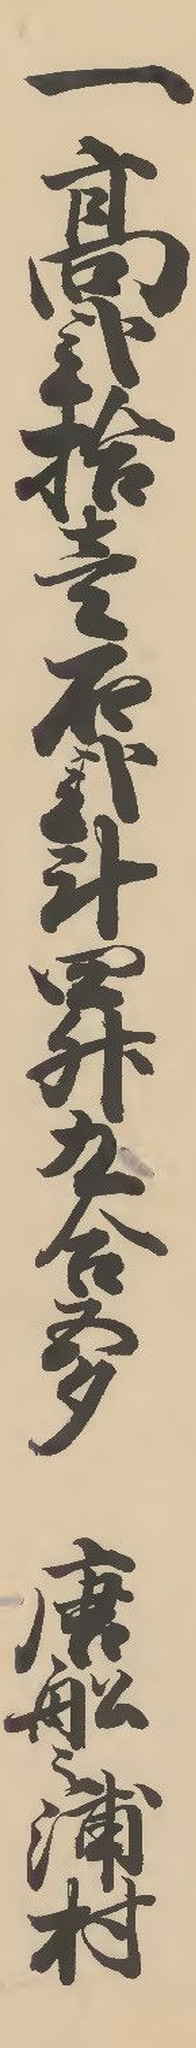一髙弐拾壱石弐斗四升九合五夕唐舩之浦村

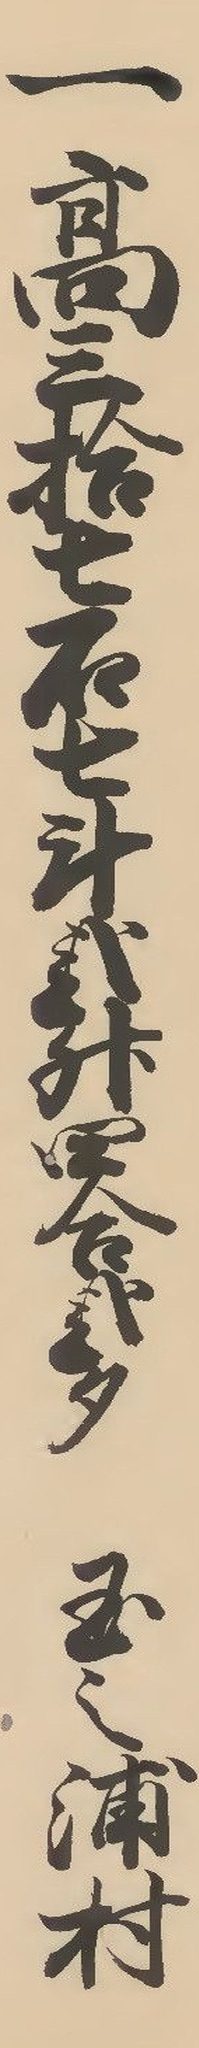一髙三拾七石七斗弐升四合弐夕玉之浦村
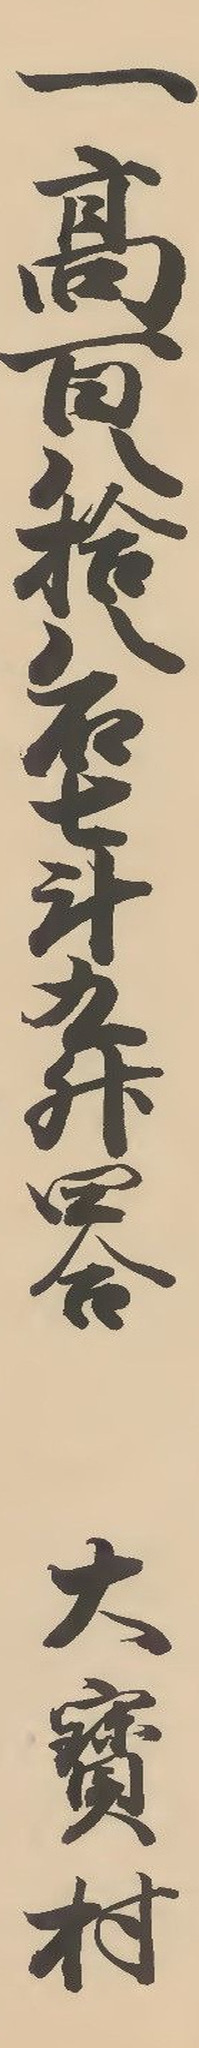一髙百八拾八石七斗九升四合大寶村
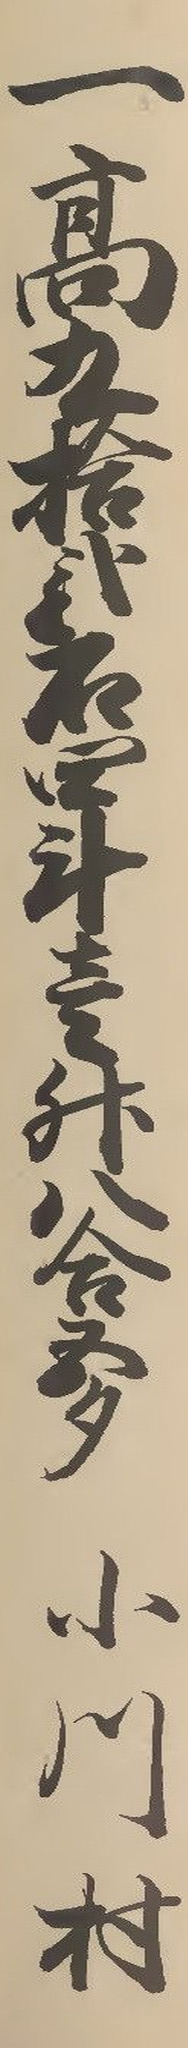一髙九拾弐石四斗壱升八合五夕小川村
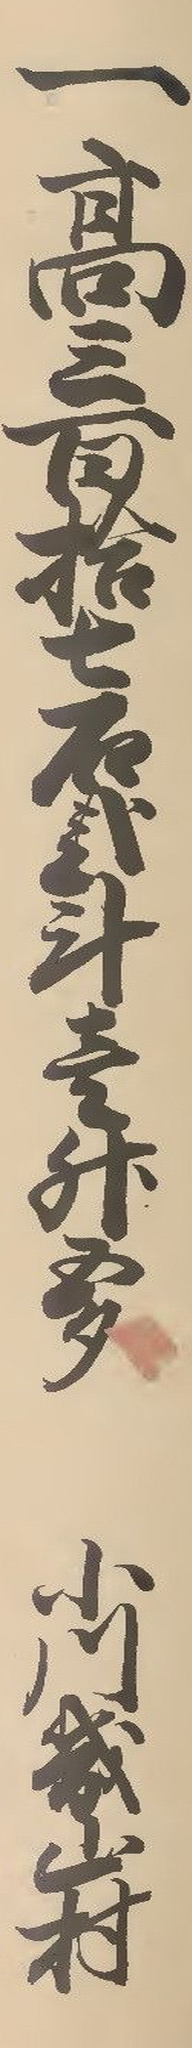一髙三百拾七石弐斗壱升五夕小川幾山村
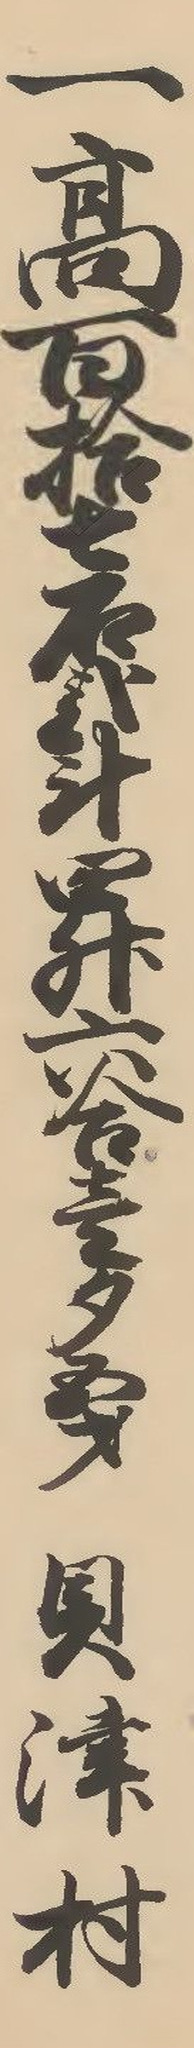一髙百拾七石弐斗四升六合壱夕五才貝津村
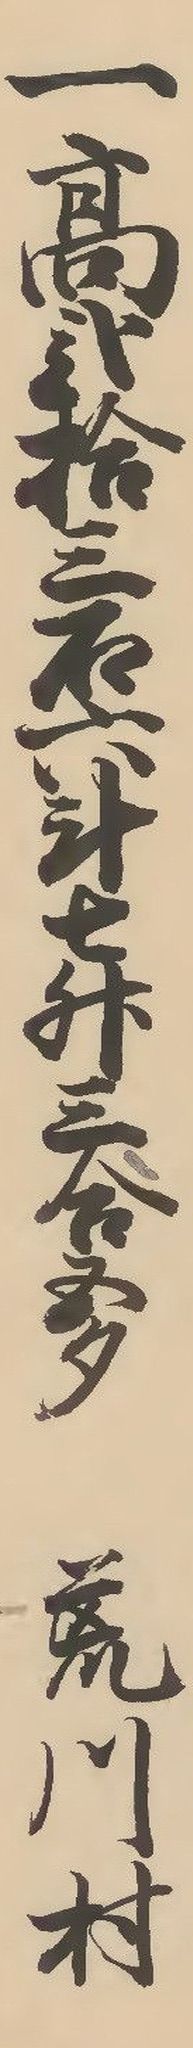一髙弐拾三石六斗七升三合五夕荒川村

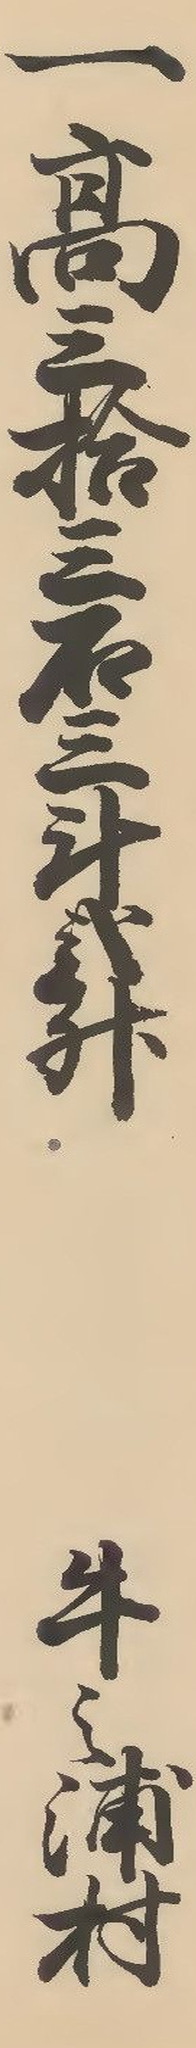一髙三拾三石三斗弐升牛之浦村
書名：肥前国郷帳
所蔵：国立公文書館 National Archives of Japan
